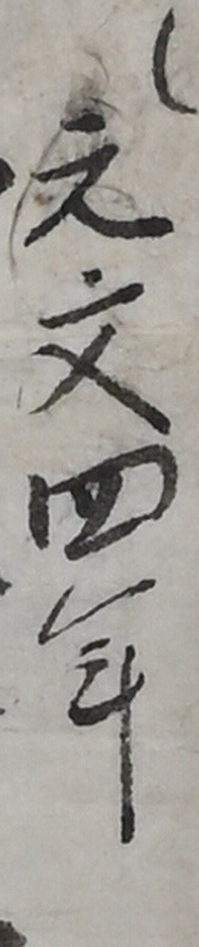元文四年
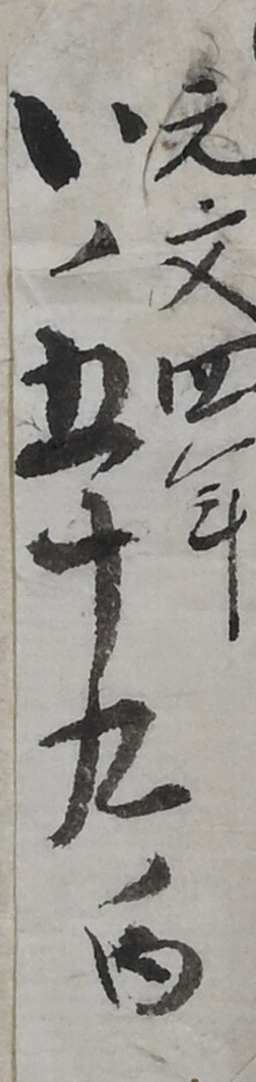いノ五十九ノ内

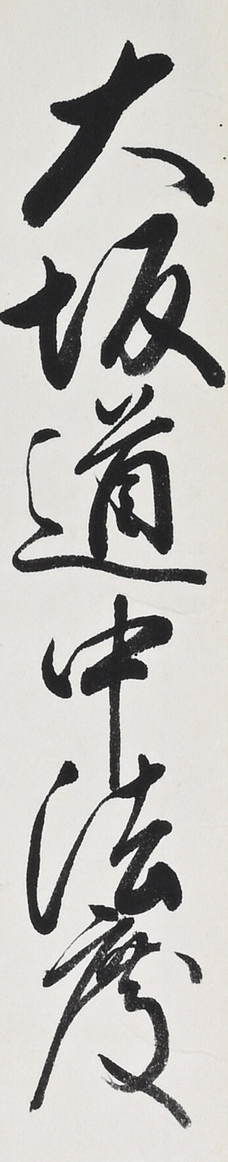大坂道中法度
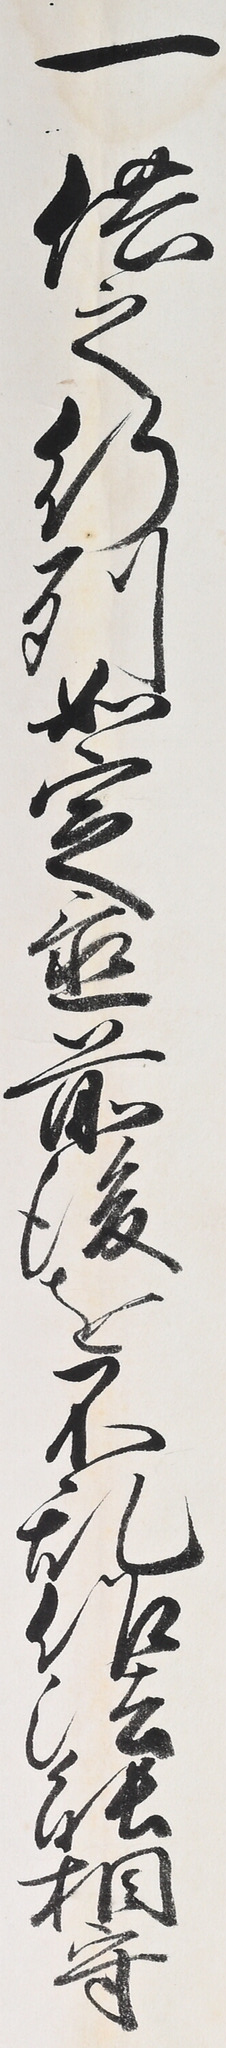一供之行列如定置前後を不乱作法能相守
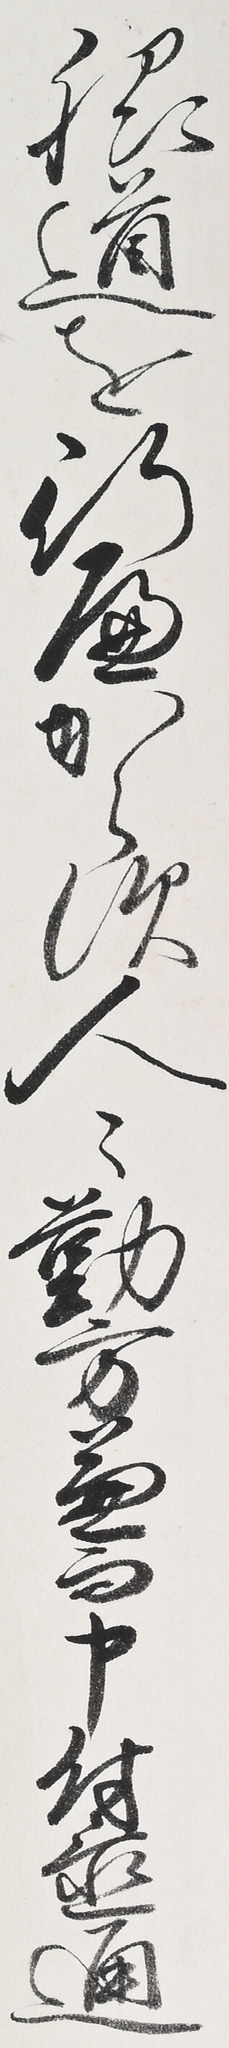脇道を行へからす人々勤方兼而申付置通
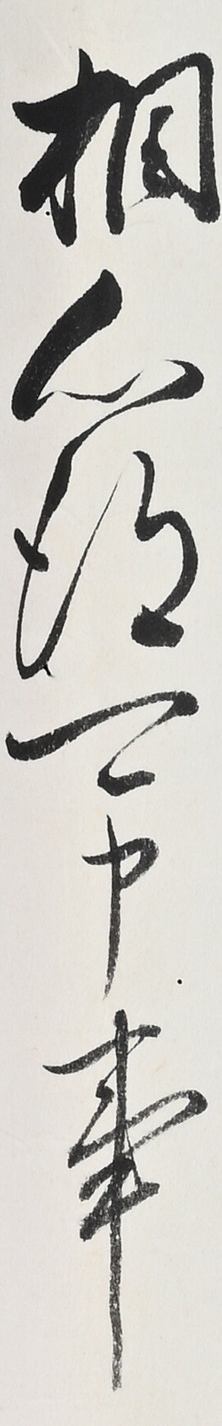相心得可申事
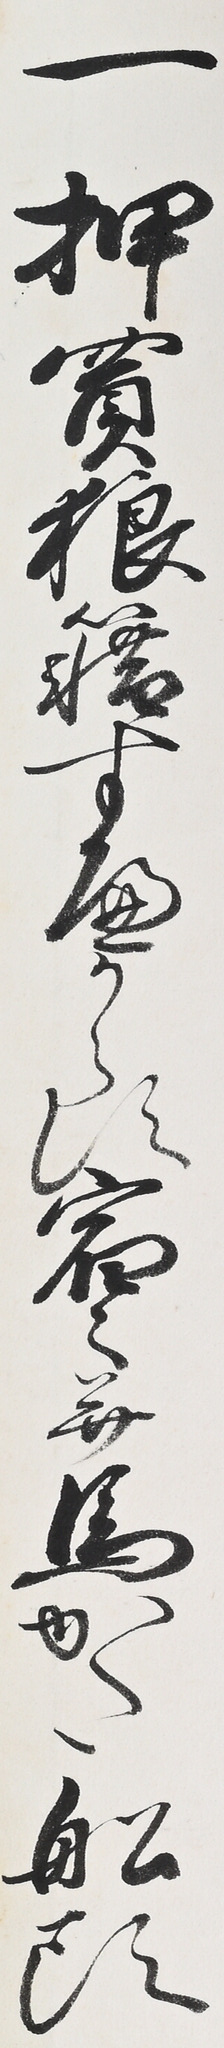一押買狼藉すへからす宿々幷馬かた舩頭
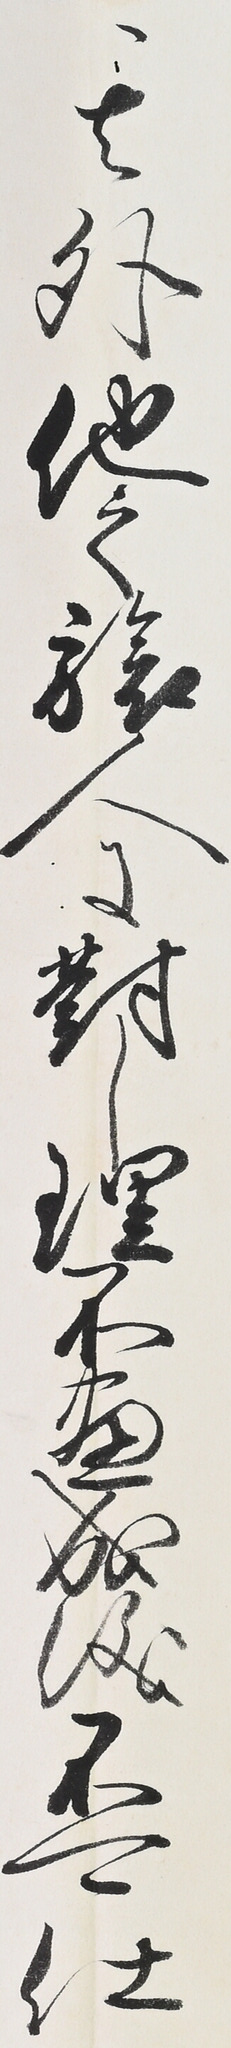其外他之旅人に対し理不尽成儀不可仕
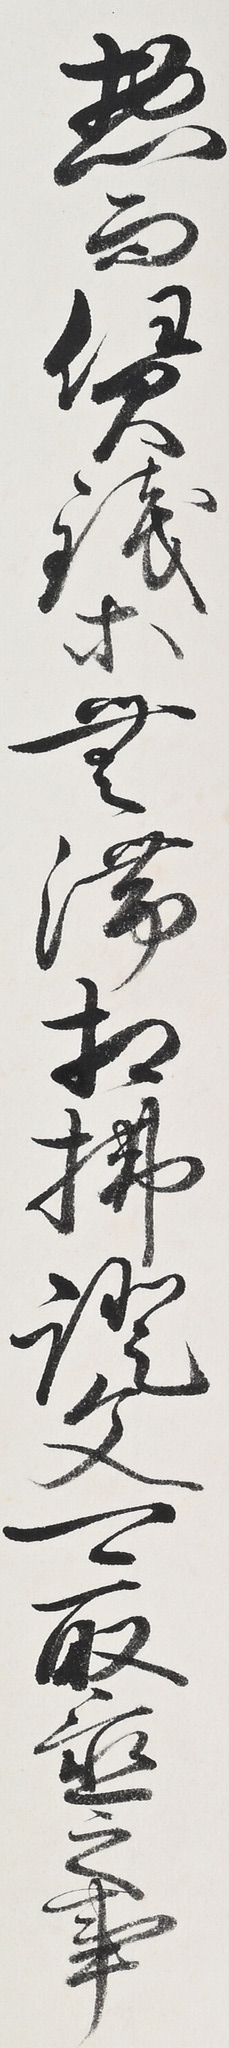惣而賃銭等無滞相払証文可取置之事
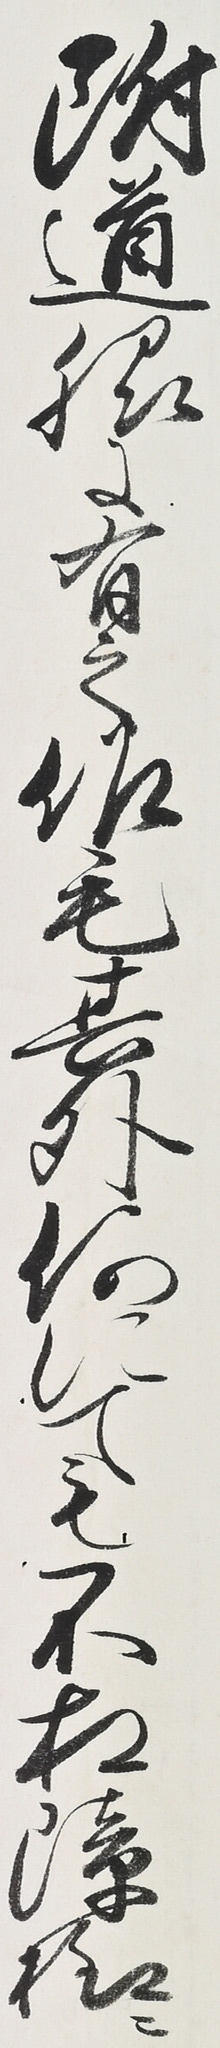附道脇に有之作毛其外何にても不相障様ニ
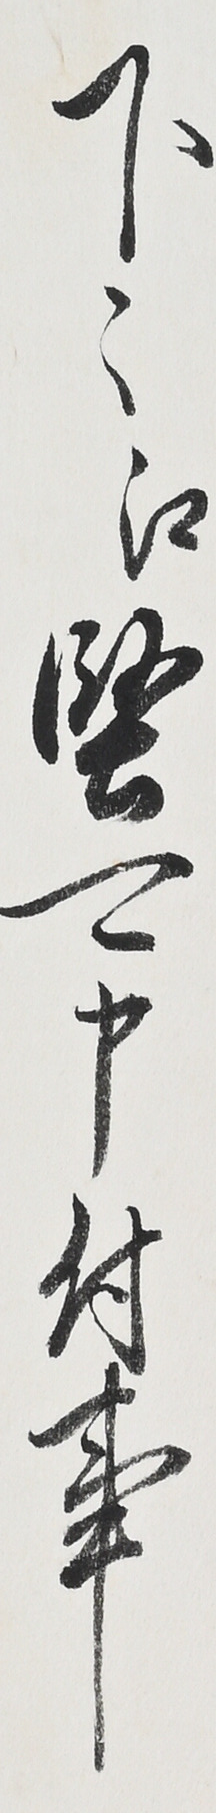下々え堅可申付事
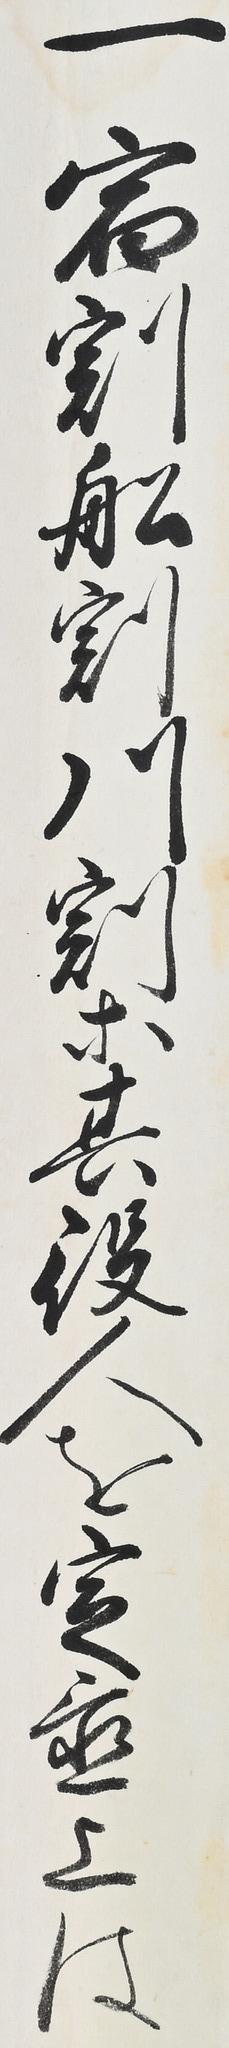一宿割舩割川割等其役人を定置上は
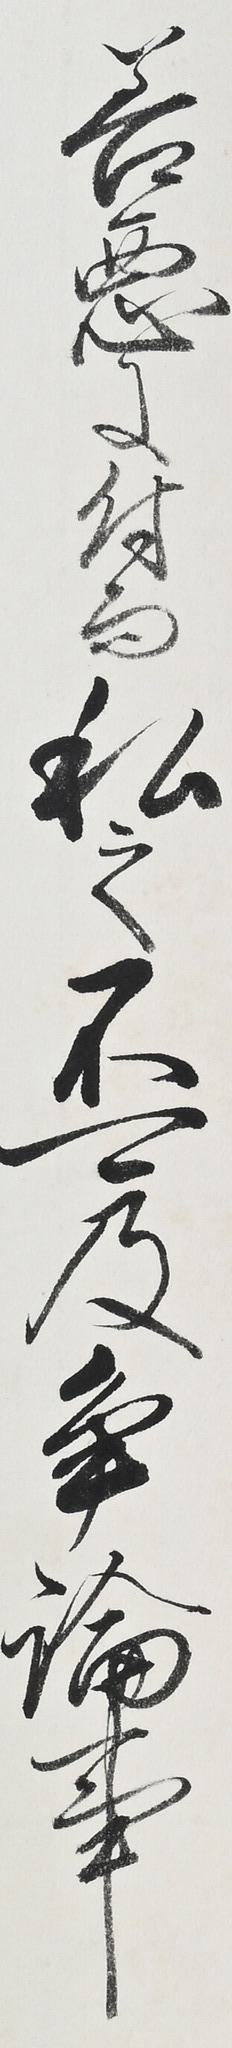善悪に付而私之不可及争論事
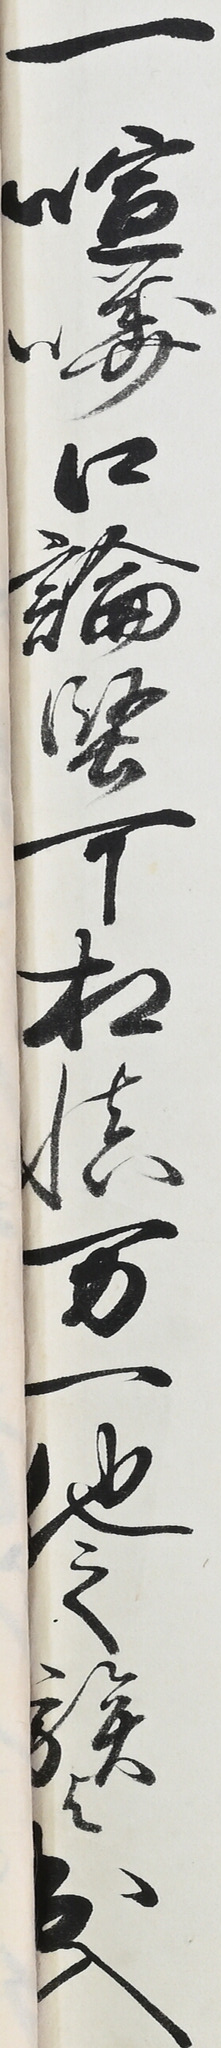一喧嘩口論堅可相慎万一外之族と出入

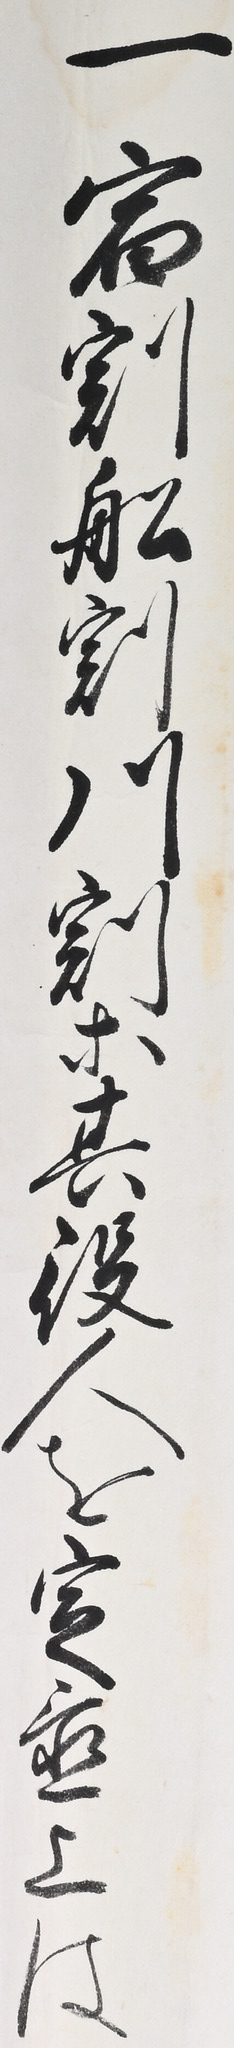一宿割舩割川割等其役人を定置上は
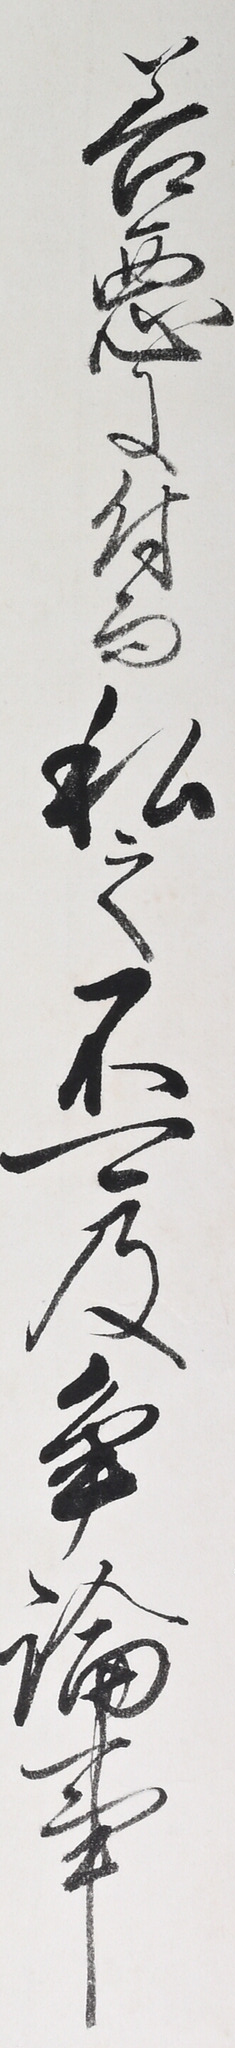善悪に付而私之不可及争論事
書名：大阪道中法度
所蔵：伊那市立高遠町図書館・合同会社AMANE
